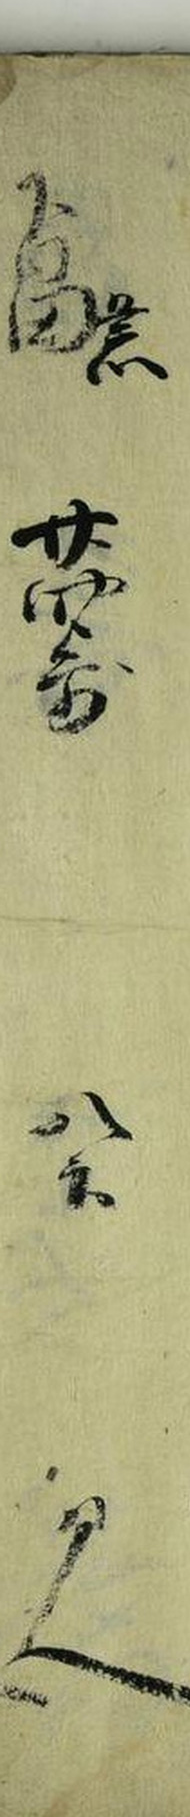下畠廿四歩八升同人
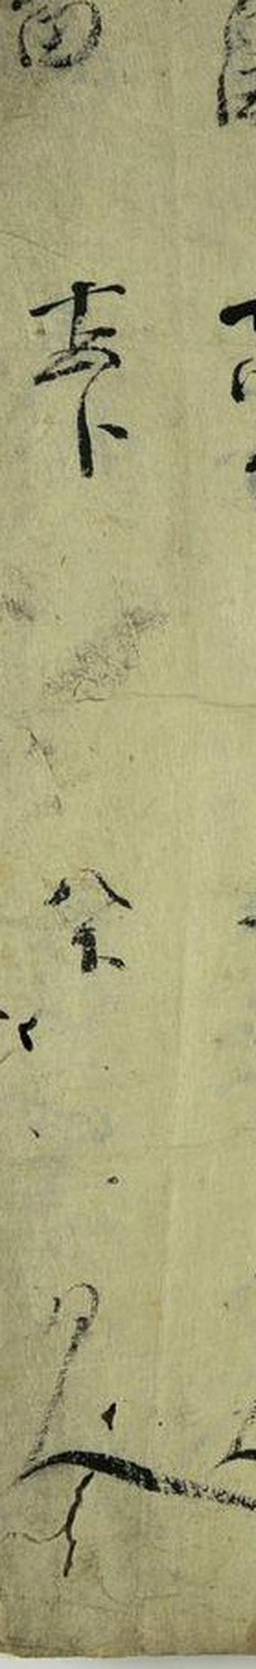上田十五歩八升同人

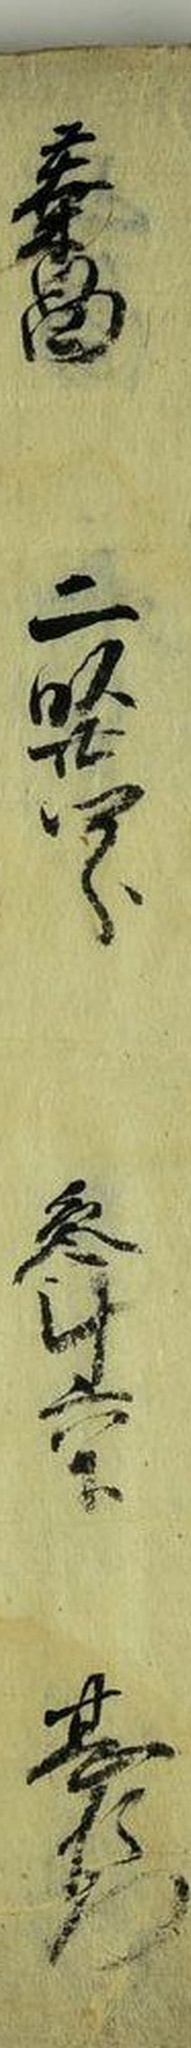桑畠二畝廿四歩参斗六升甚左衛門
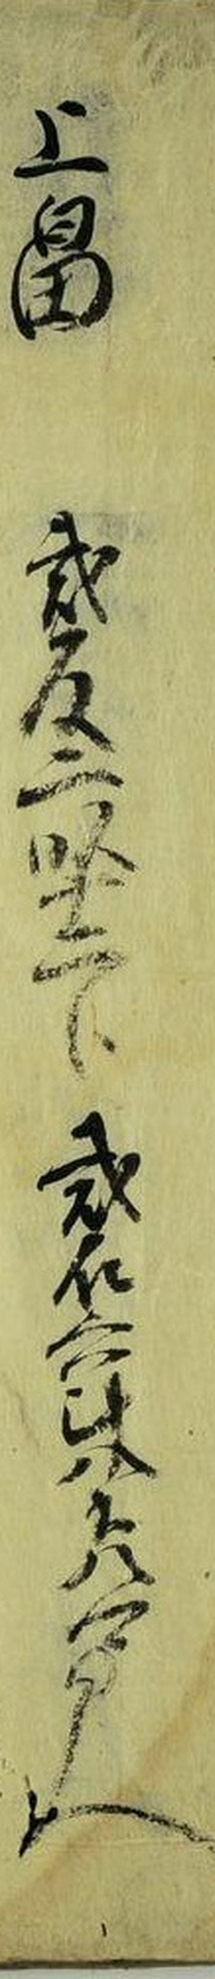上畠二反二畝十二歩弐石六斗八升八合同人
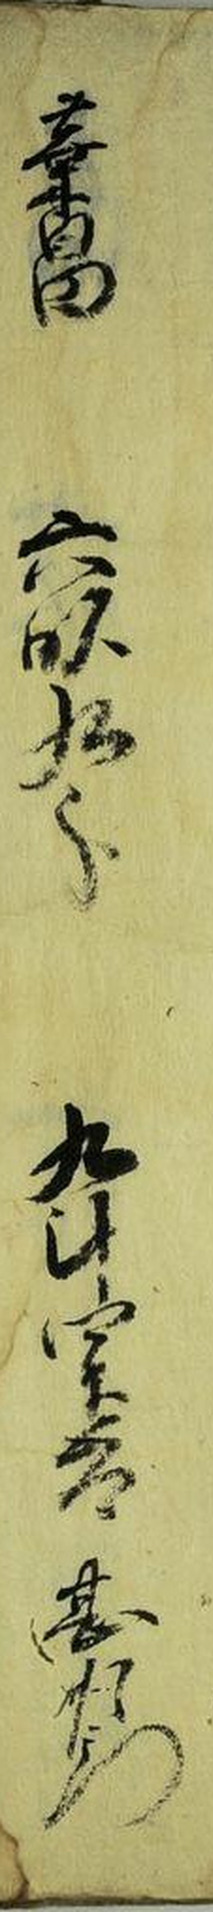桑畠六畝九歩九斗四升五合甚左衛門
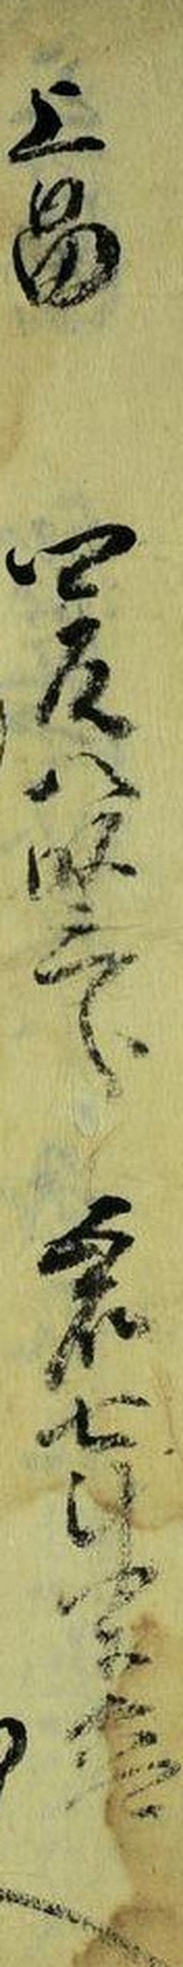上畠四反八畝三歩五石七斗四升六合
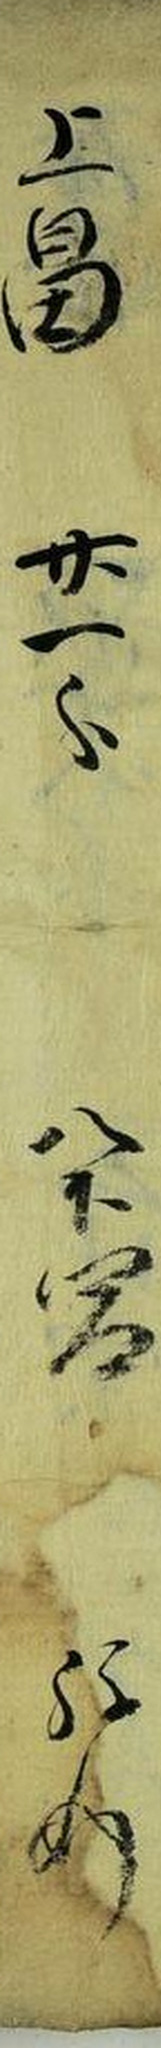上畠廿一歩八升四合弥介
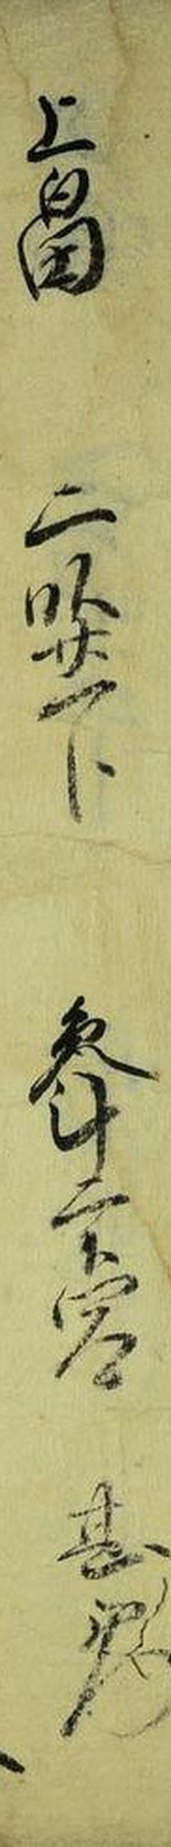上畠二畝廿一歩石斗升合甚左衛門
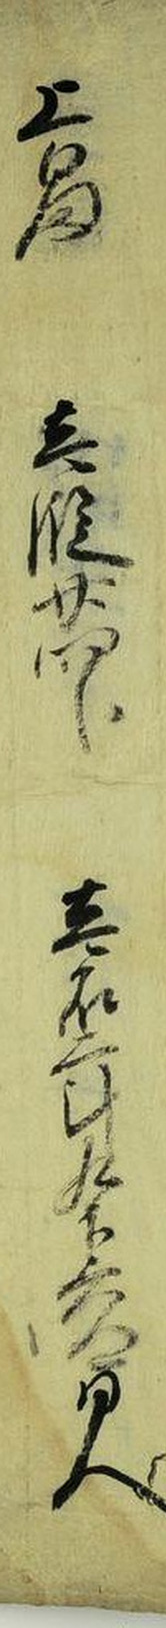上畠壱段廿四歩壱石二斗九升六合同人

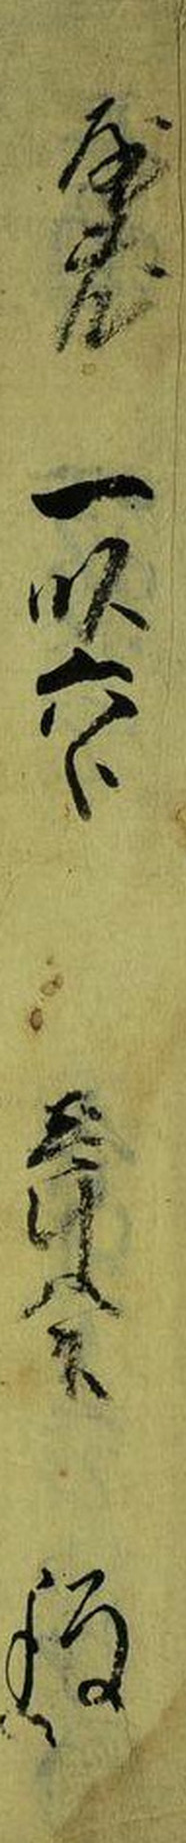屋敷一畝六歩五斗八升
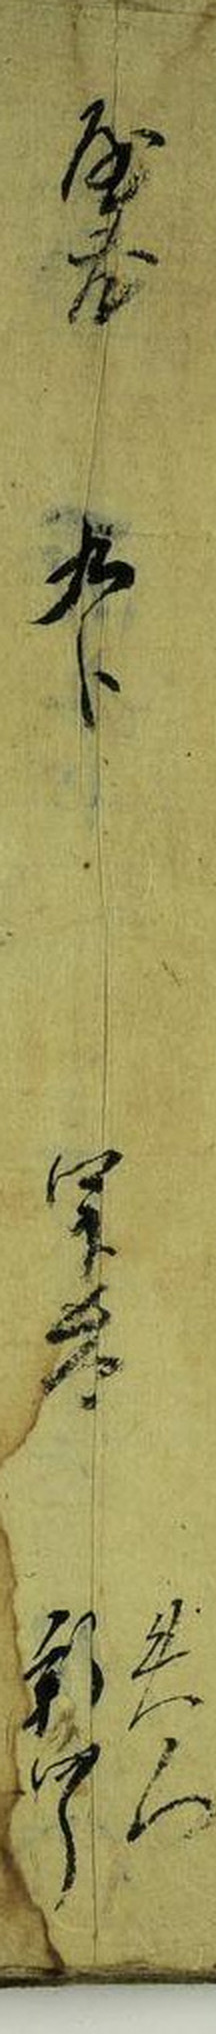屋敷九斗四升五合衛門
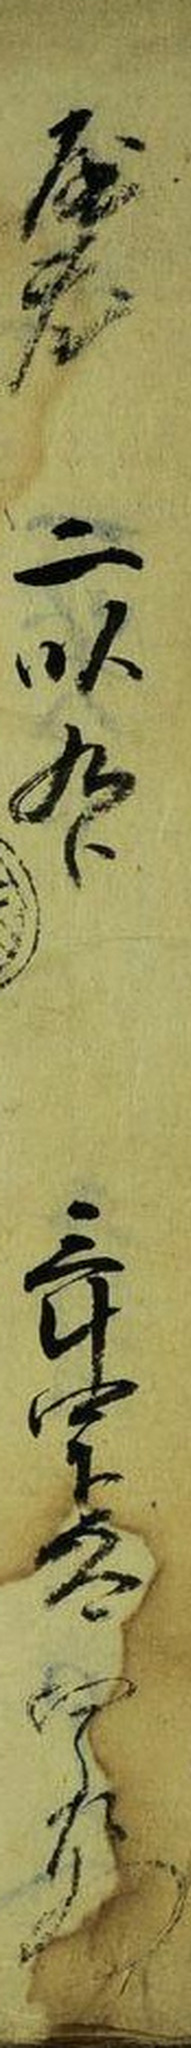屋敷二畝九歩三斗四升五合四郎左衛門

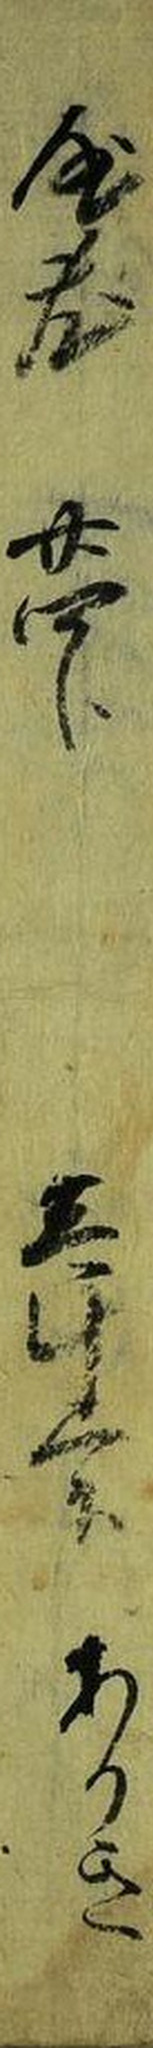屋敷廿四歩一斗二升ありき
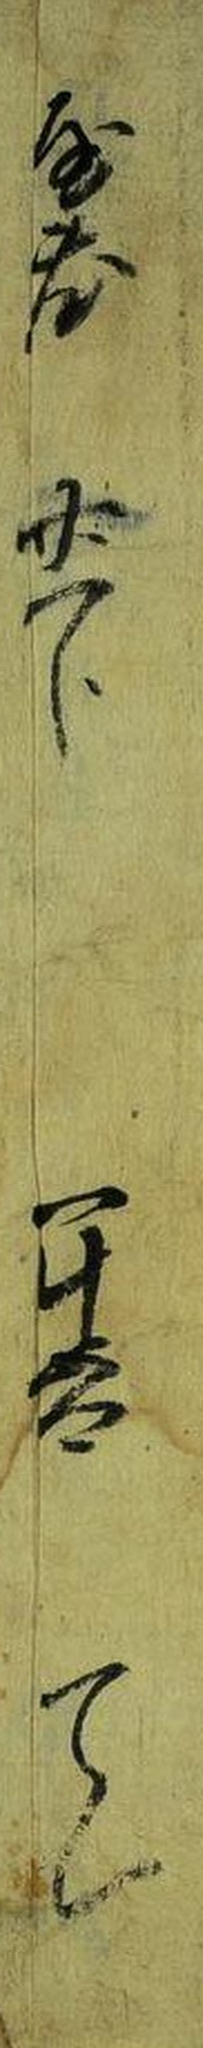屋敷廿一歩一斗五合てし
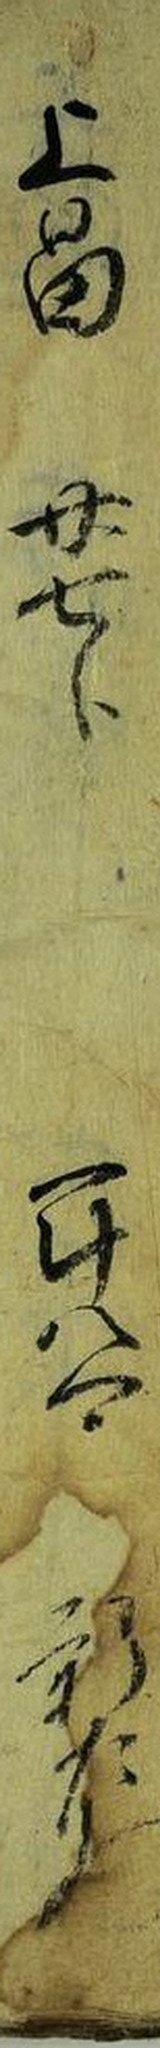上畠廿七歩一斗八合新左衛門
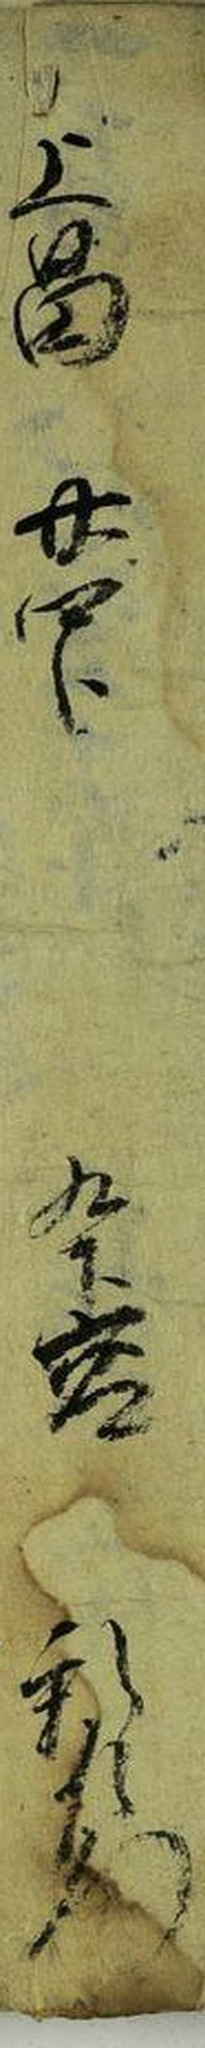上畠廿四歩九斗六合新左衛門
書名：越前国中墨郡安沢村水帳（太閤検地帳）
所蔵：福井県文書館 Fukui Prefectural Archives
